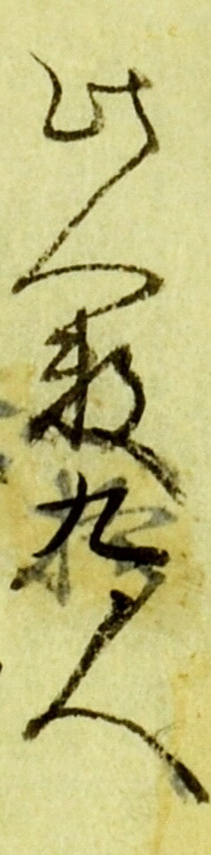此人数九人
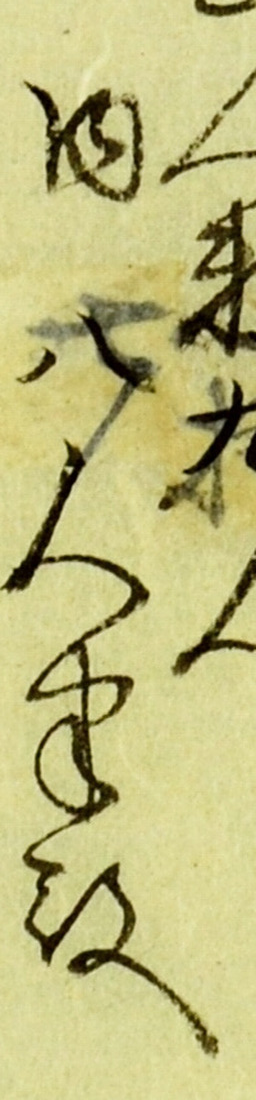内八人半役
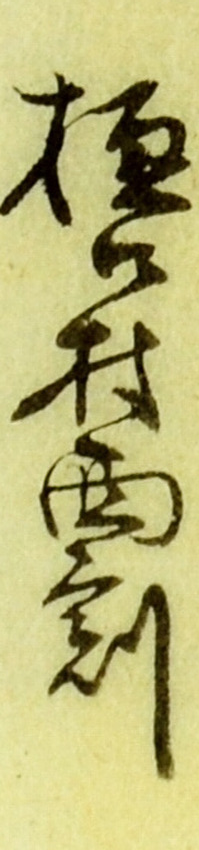樋口村西割
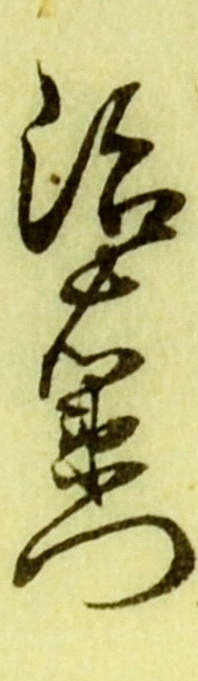治右衛門
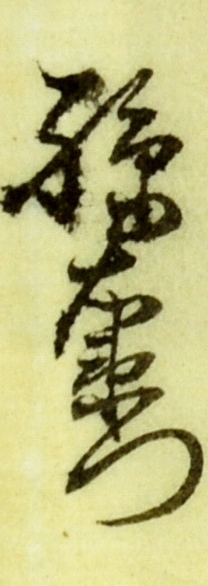治右衛門
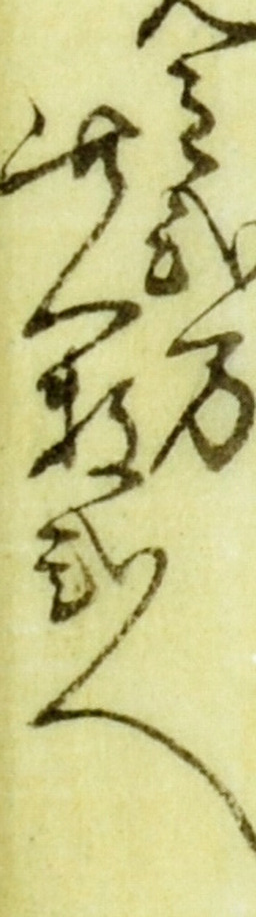此人数弐人

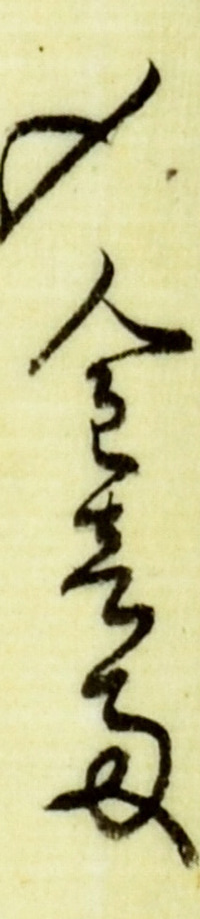〆金壱両
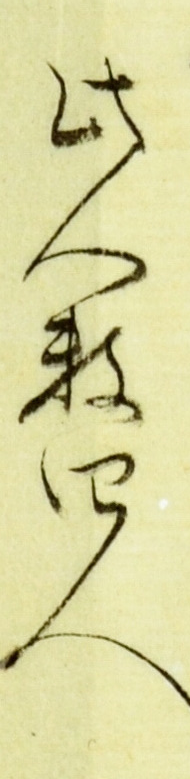此人数四人
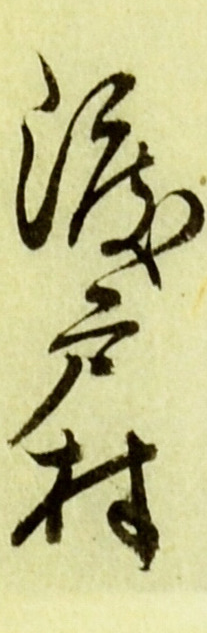渡戸村
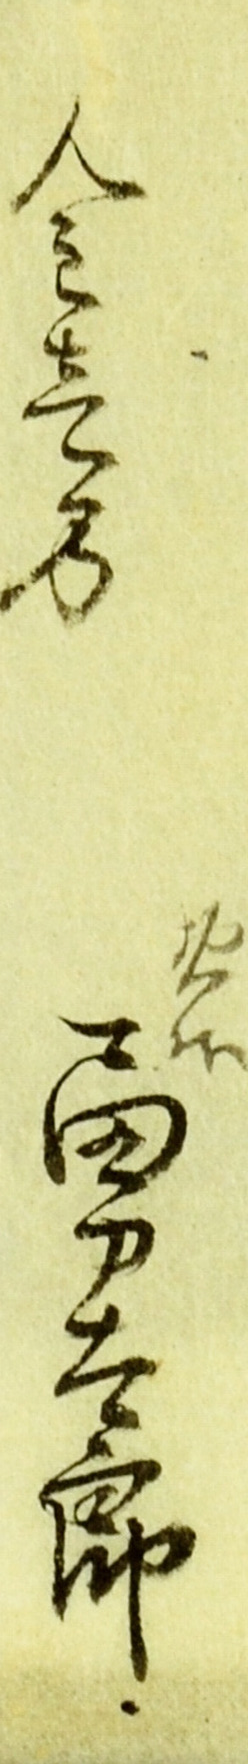金壱分惣代勇太郎
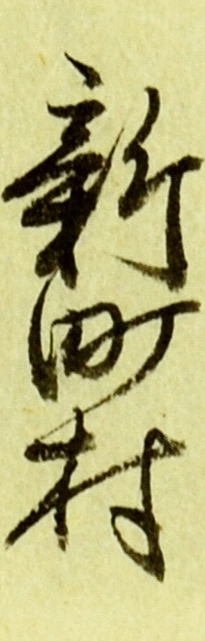新町村
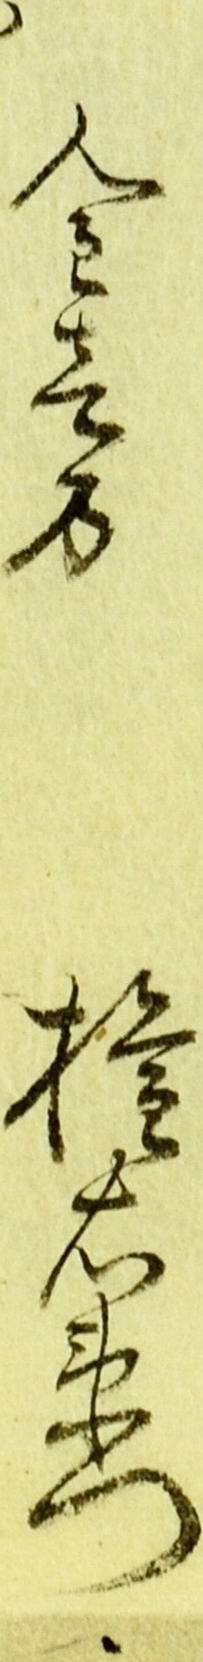金壱分権右衛門
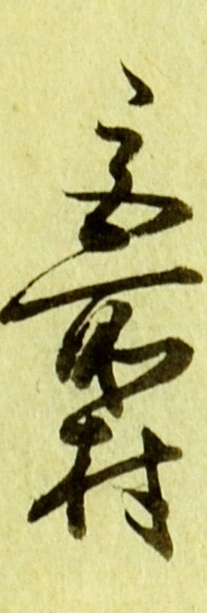宮所村
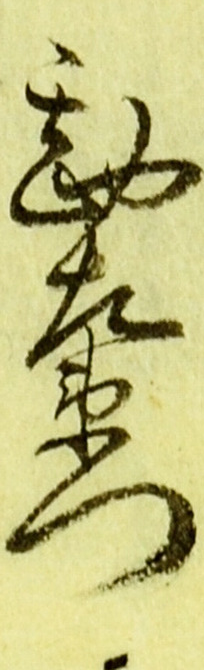勘左衛門
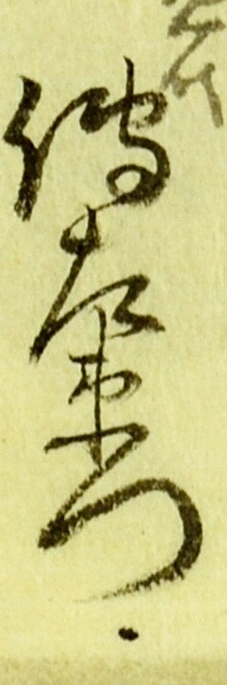勘左衛門
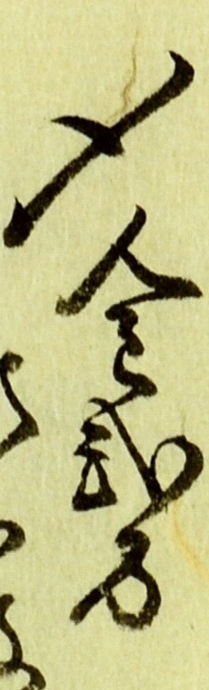〆金弐分
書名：上伊那郷諸運上取調帳
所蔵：伊那市立高遠町図書館・合同会社AMANE
